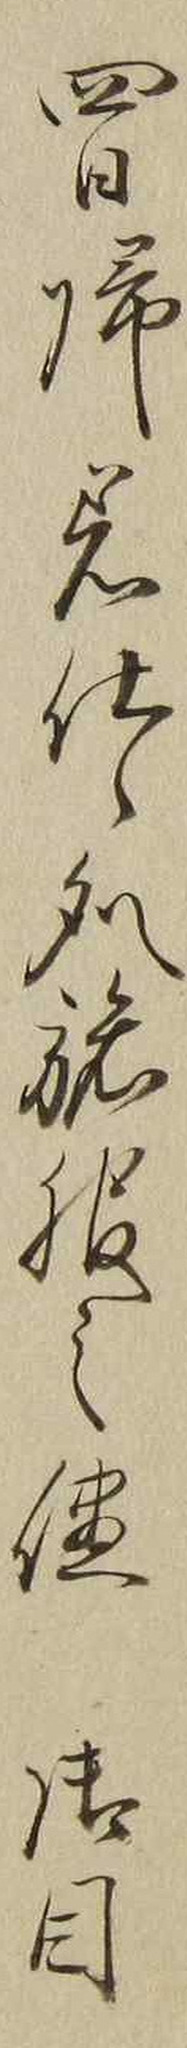四日帰着仕候処旅服之儘御目
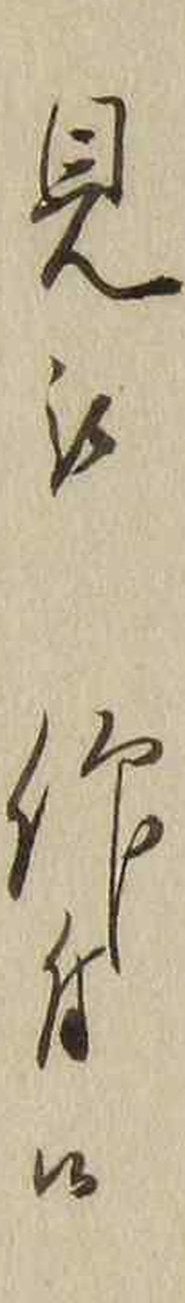見被仰付候
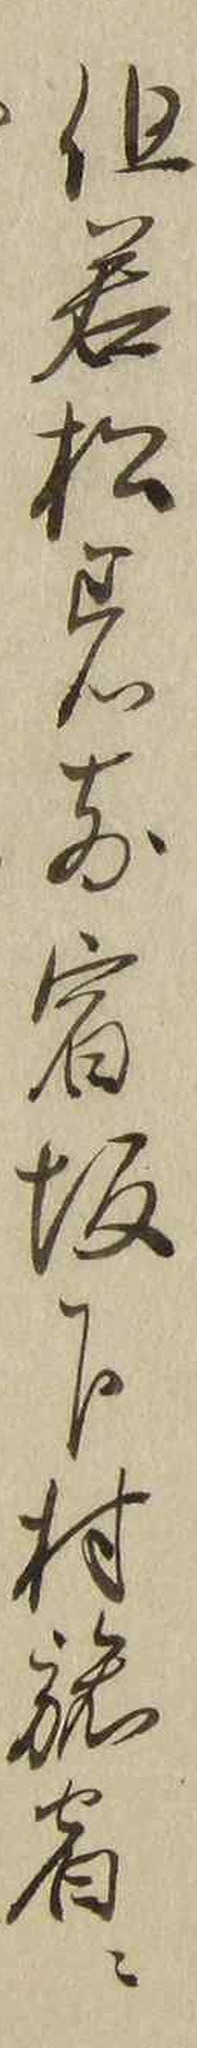但若松着前宿坂下村旅宿に
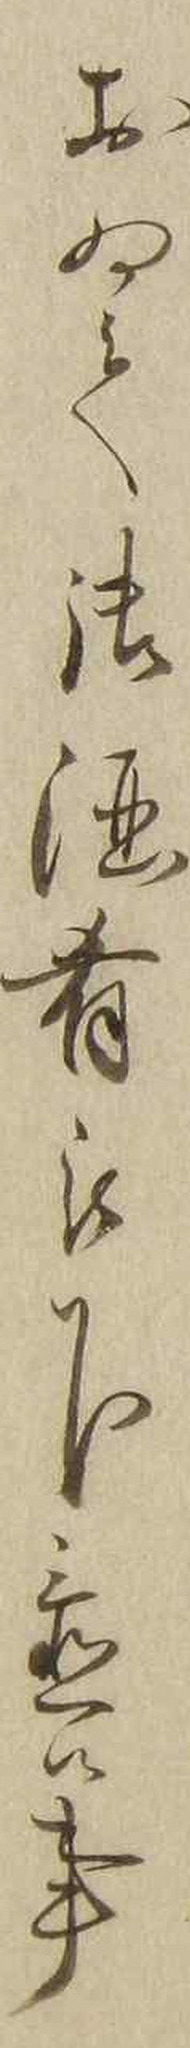おゐて御酒肴被下置候事

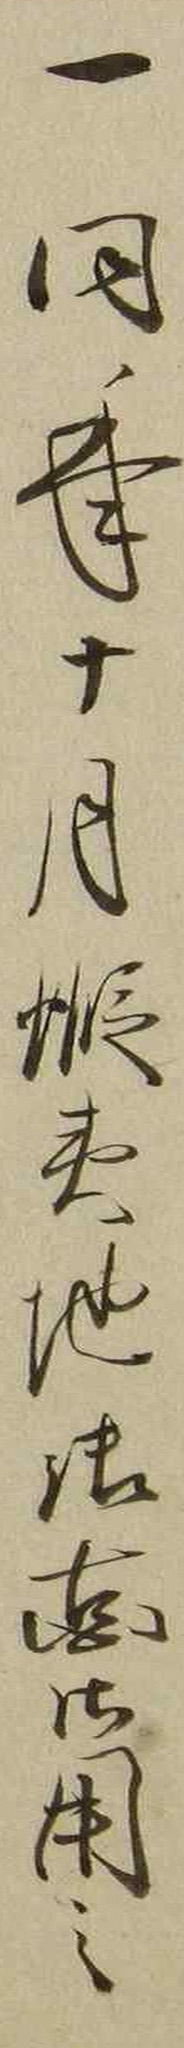一同年十月蝦夷地御固御用之
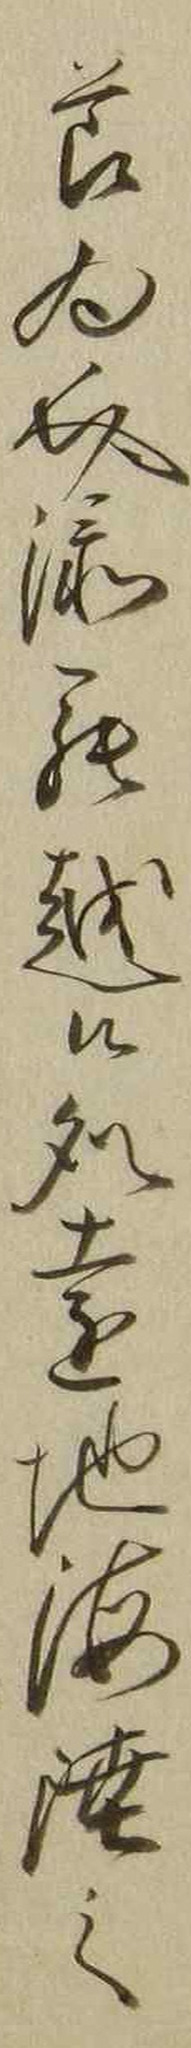節為介添罷越候処遠地海陸之
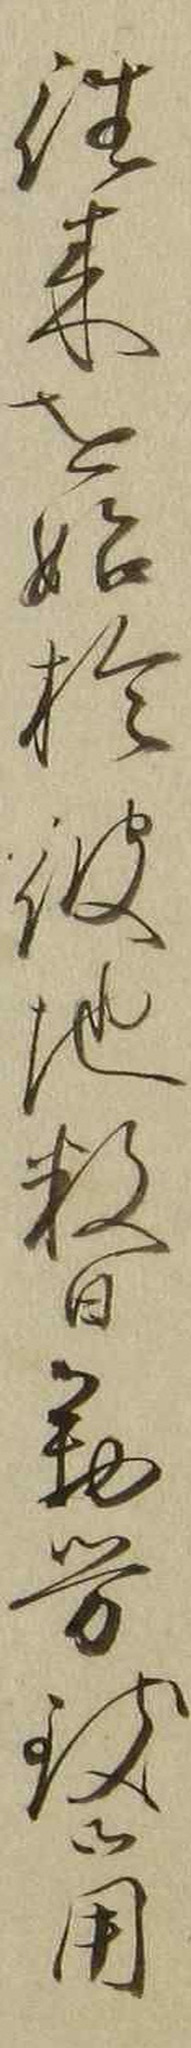往来を始於彼地数日勤労致御用
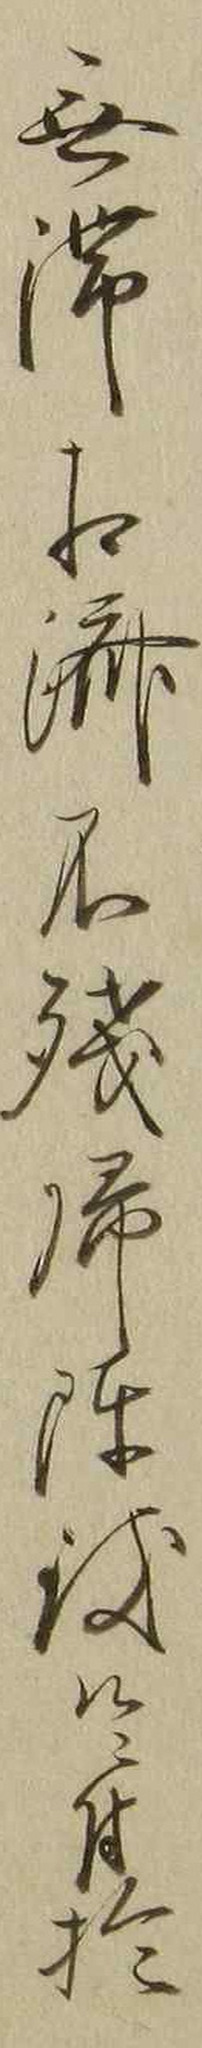無滞相済不残帰陣致候に付於
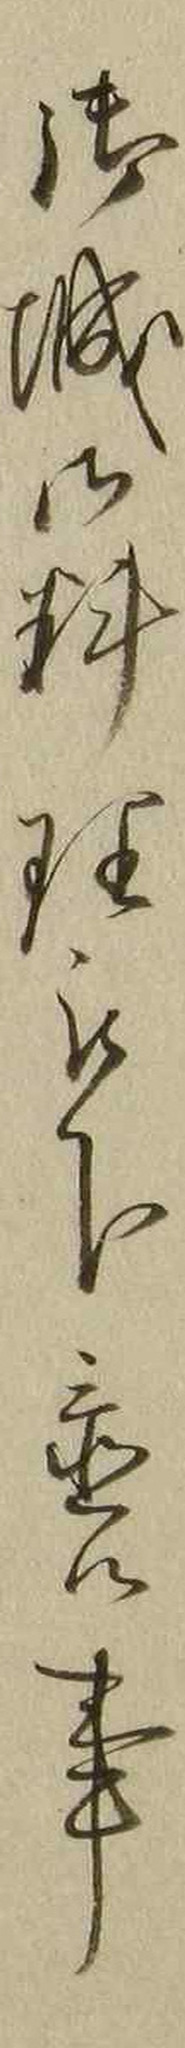御城御料理被下置候事
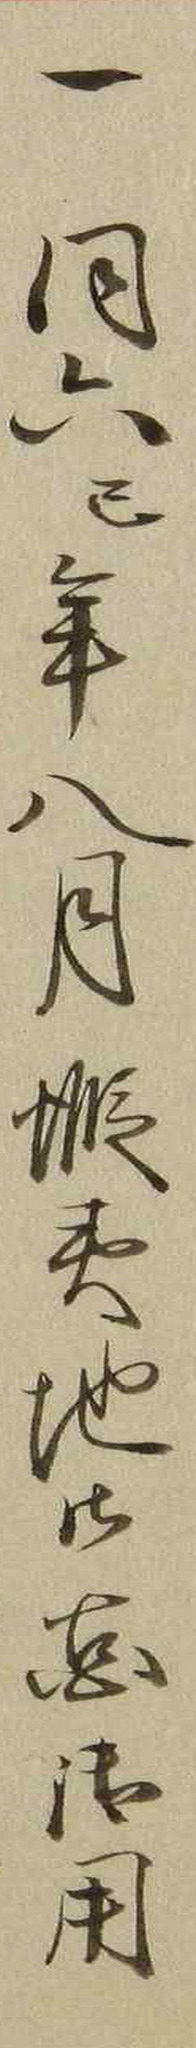一同六巳年八月蝦夷地御固御用
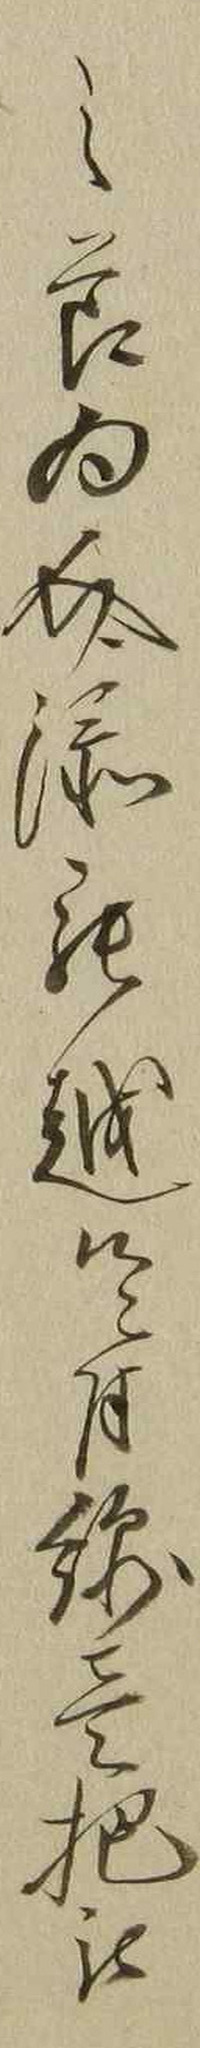之節為介添罷越候に付綿壱把被
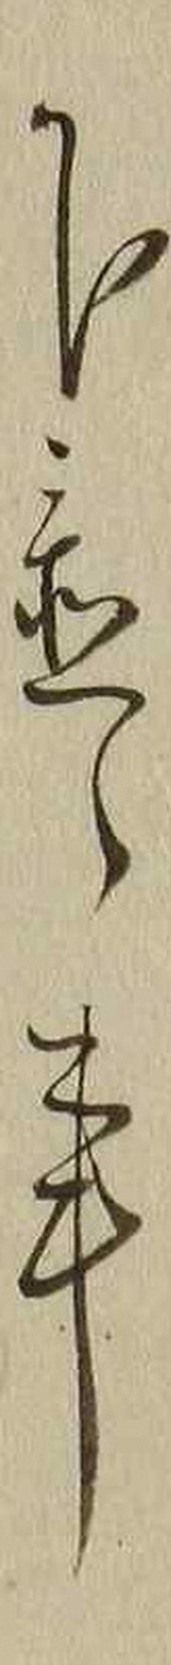下置候事
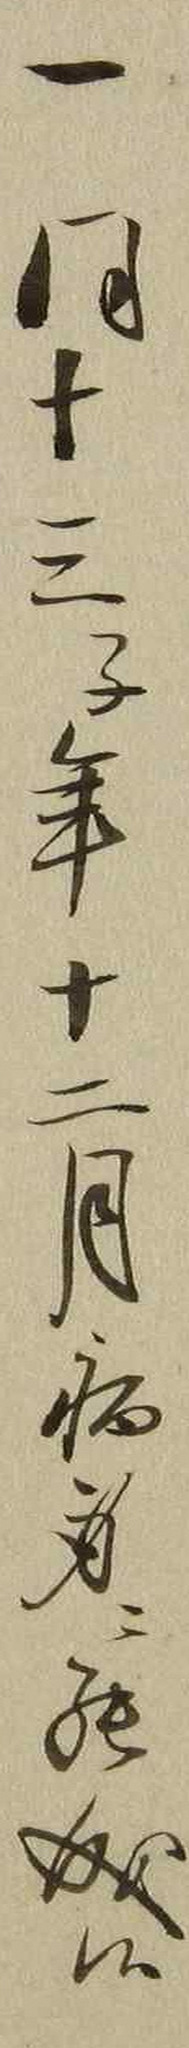一同十三子年十二月病身に罷成候
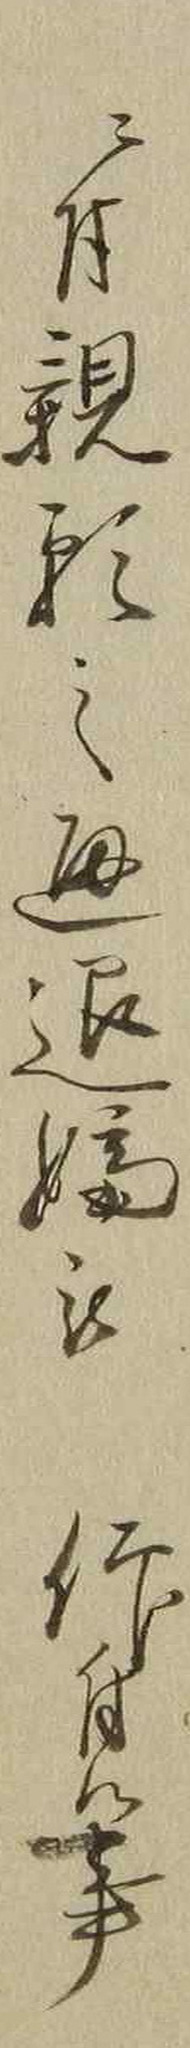に付親願之通退嫡被仰付候事
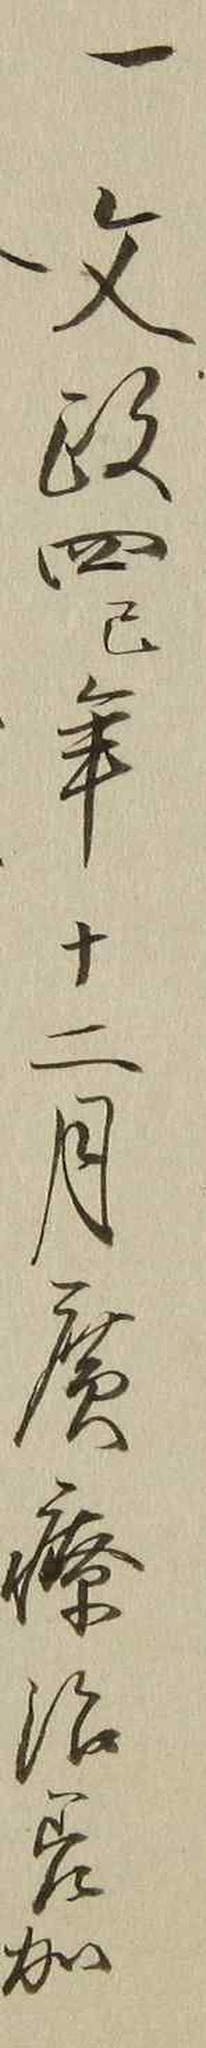一文政四巳年十二月広療治差加
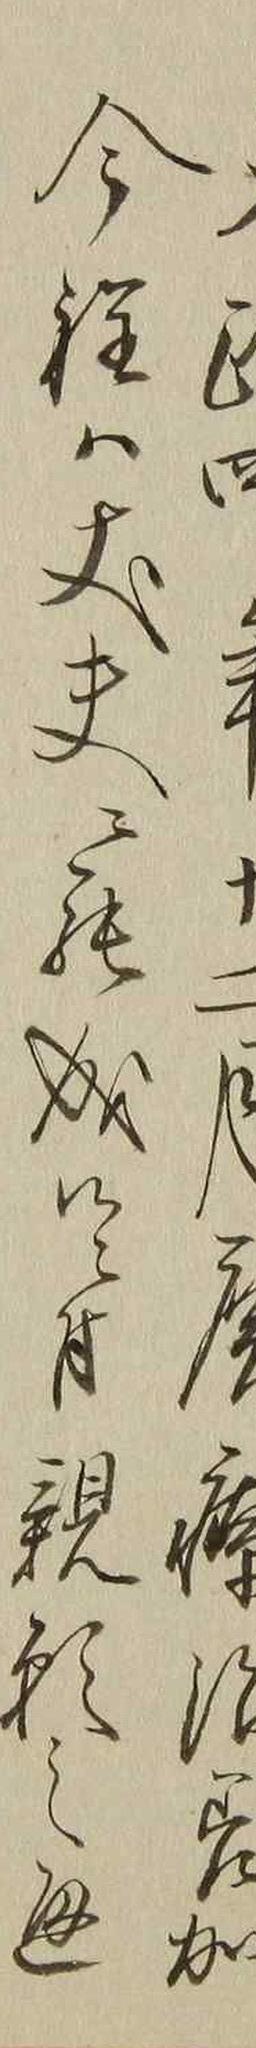今程は丈夫に罷成候に付親願之通
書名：諸士系譜　巻之103　か之部11
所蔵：会津若松市立会津図書館
